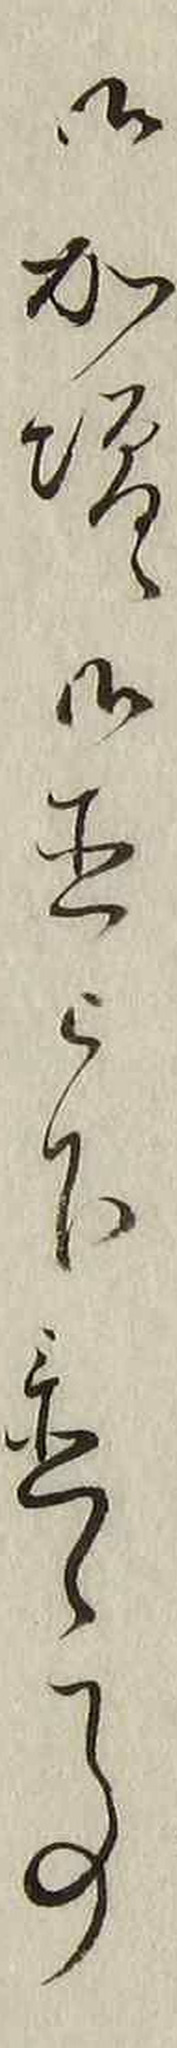御加増へ御直被下置候事
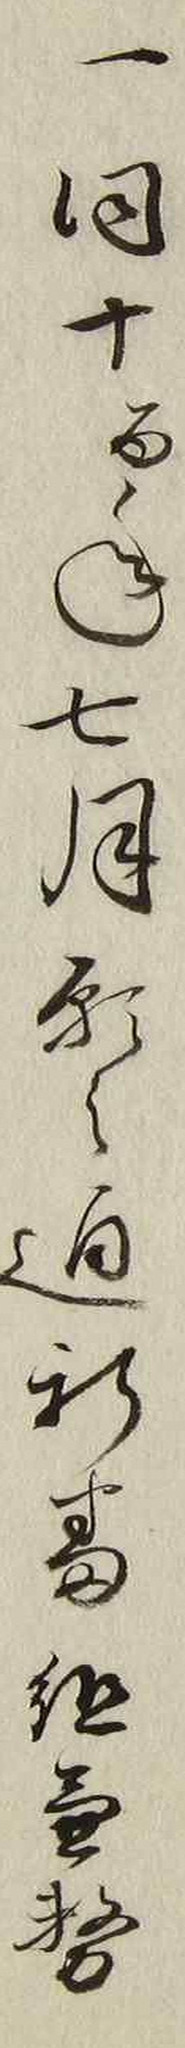一同十酉年七月願之通新番組兼務
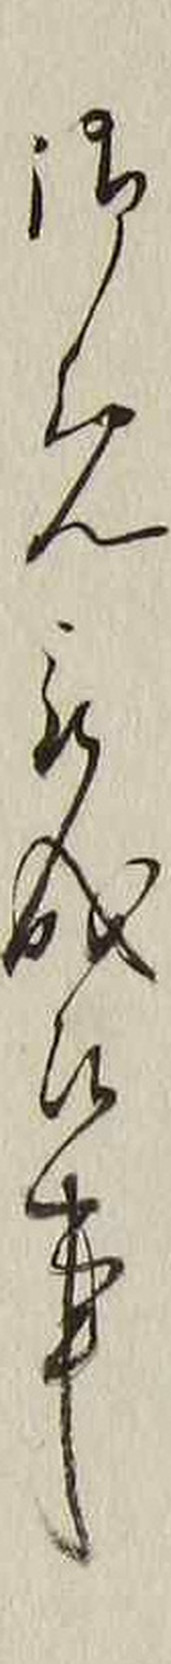御免被成候事
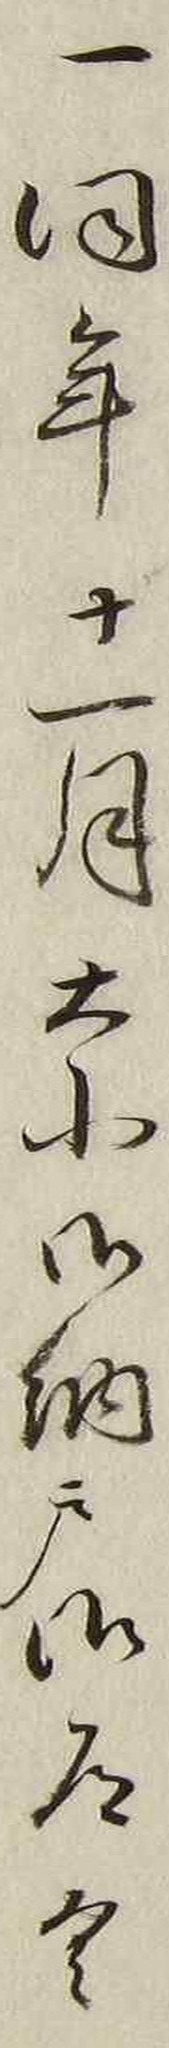一同年十一月大小御納戸御道具
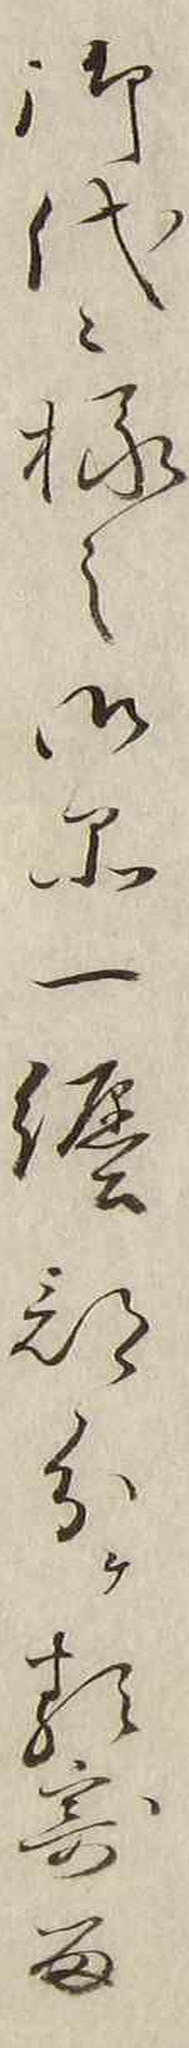御代々様之御品一纒部分ケ類寄留

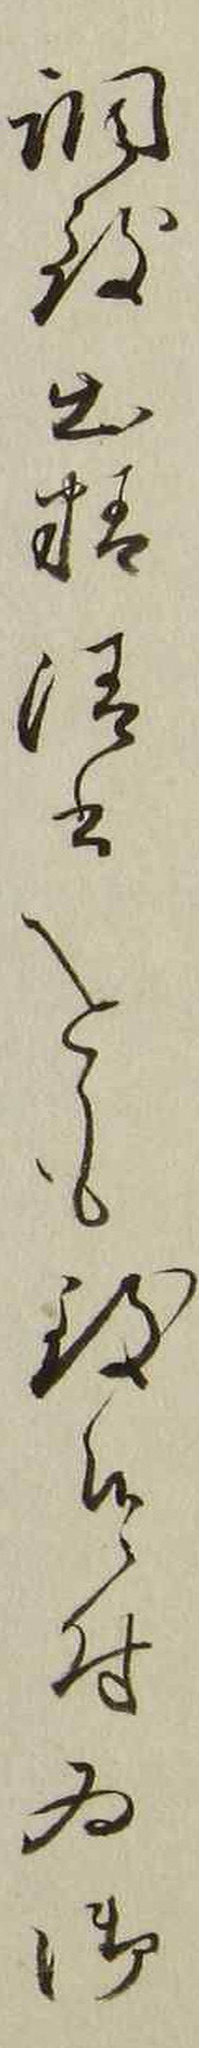調致出精清書をも致候ニ付為御
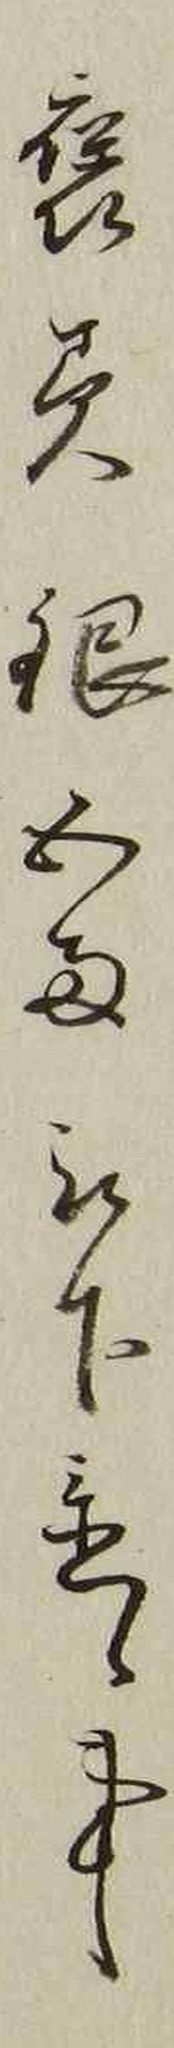褒美銀五両被下置候事
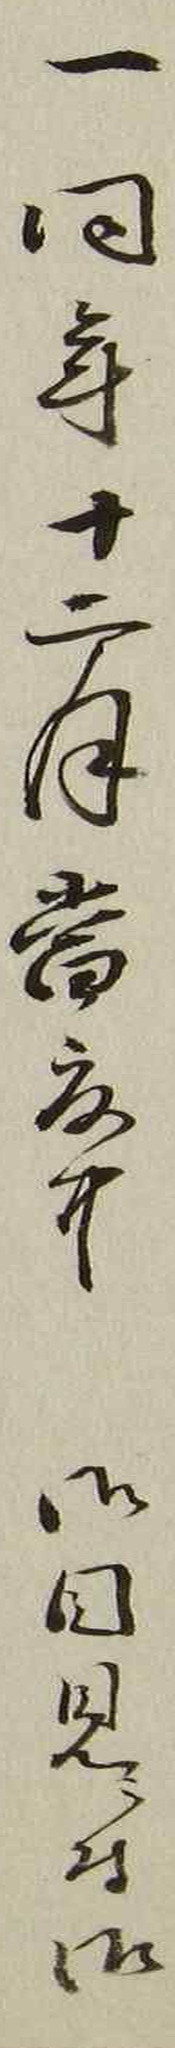一同年十二月当夏中御目見ニ付御
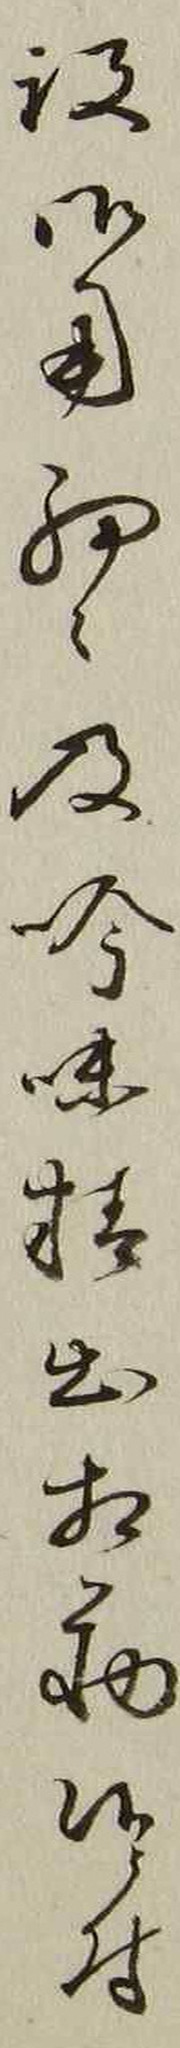役御用細々及吟味精出相勤候ニ付
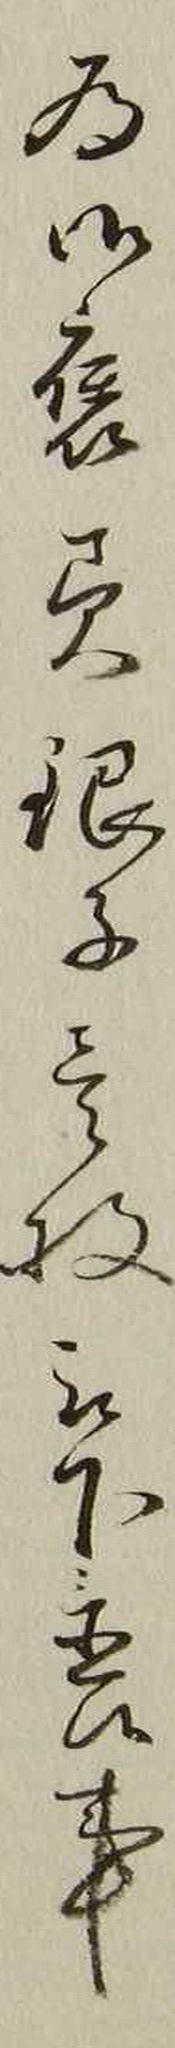為御褒美銀子壱枚被下置候事
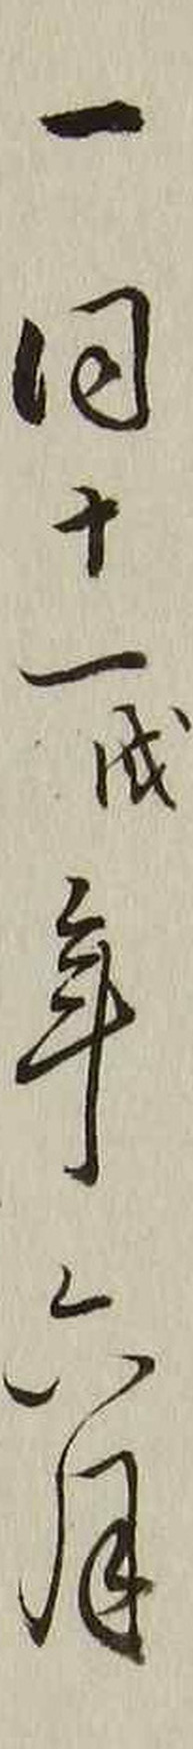一同十一戌年六月
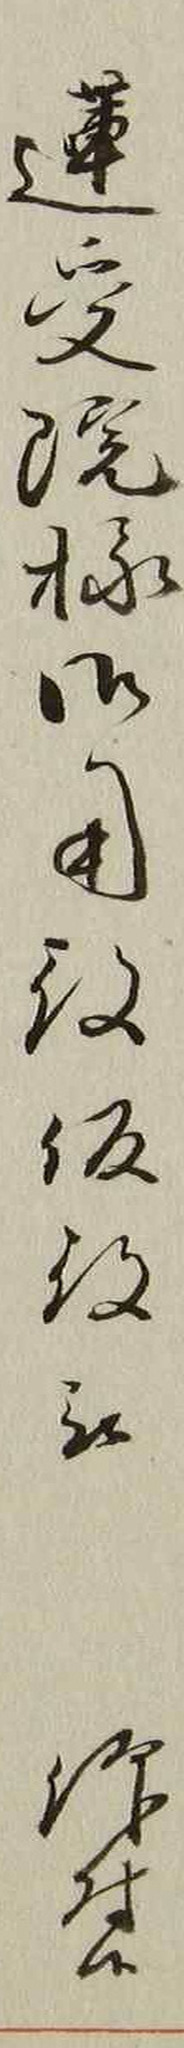蓮受院様御用役仮役被仰付候
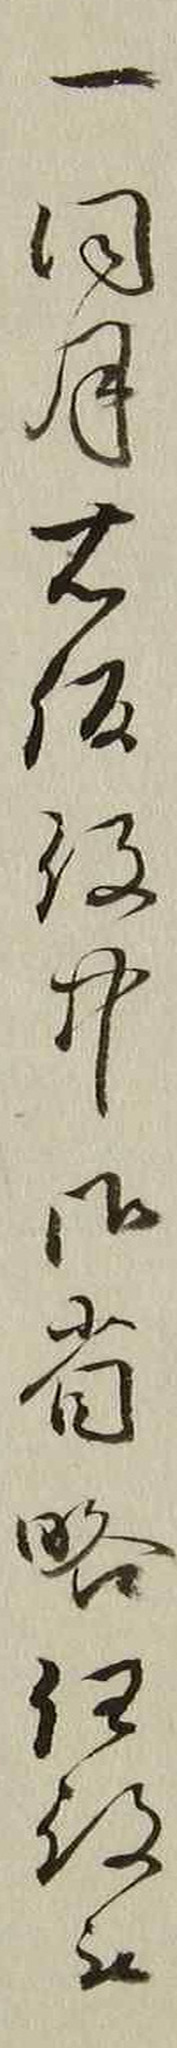一同月右仮役中御省略任役被
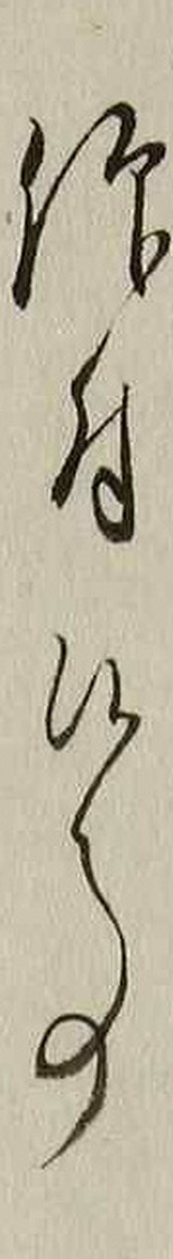仰付候事
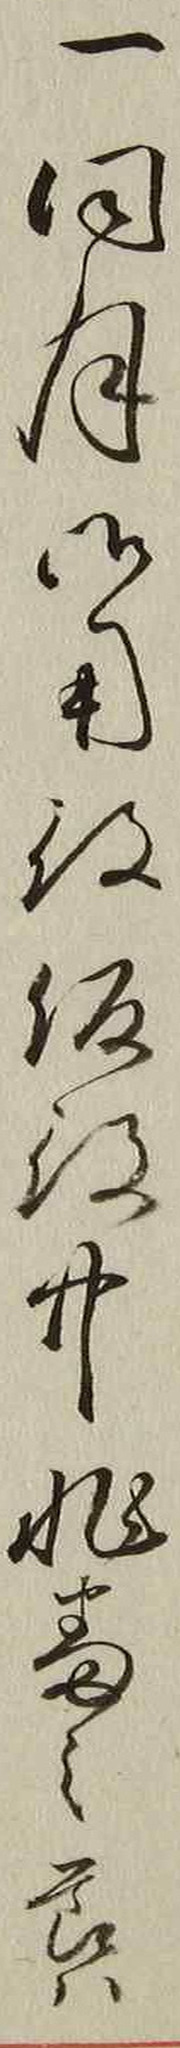一同月御用役仮役中非番之節ハ
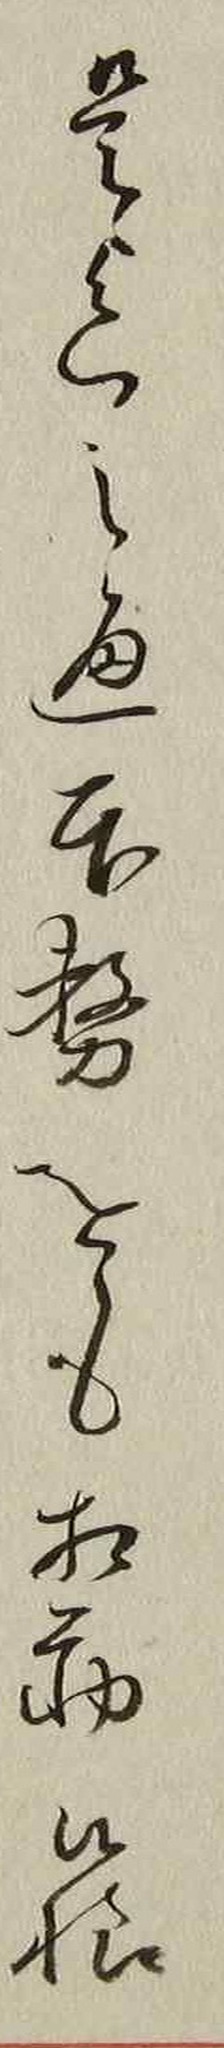是迄之通本務をも相勤候様
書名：諸士系譜　巻之4　い之部4
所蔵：会津若松市立会津図書館
